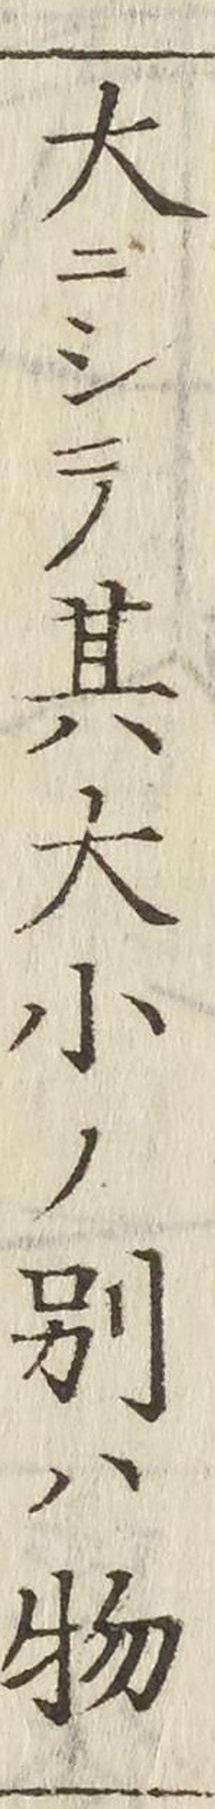大ニシテ其大小ノ別ハ物
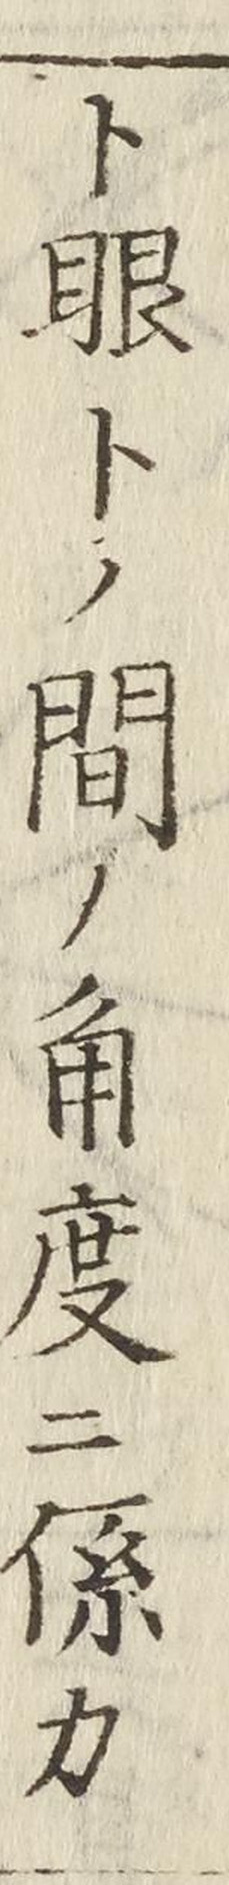ト眼トノ間ノ角度ニ係カ
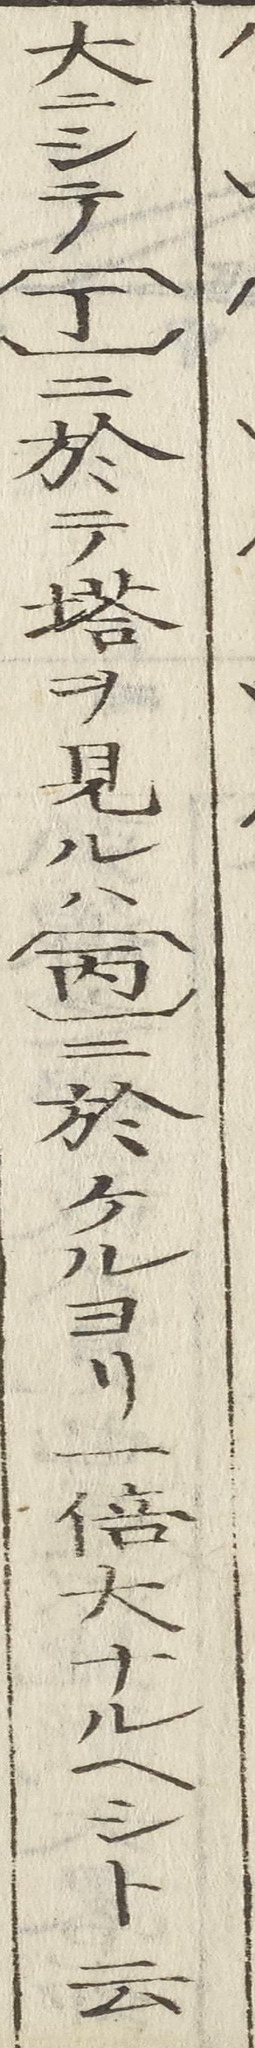大ニシテニ於テ塔ヲ見ルハニ於ケルヨリ一倍大ナルヘシト云
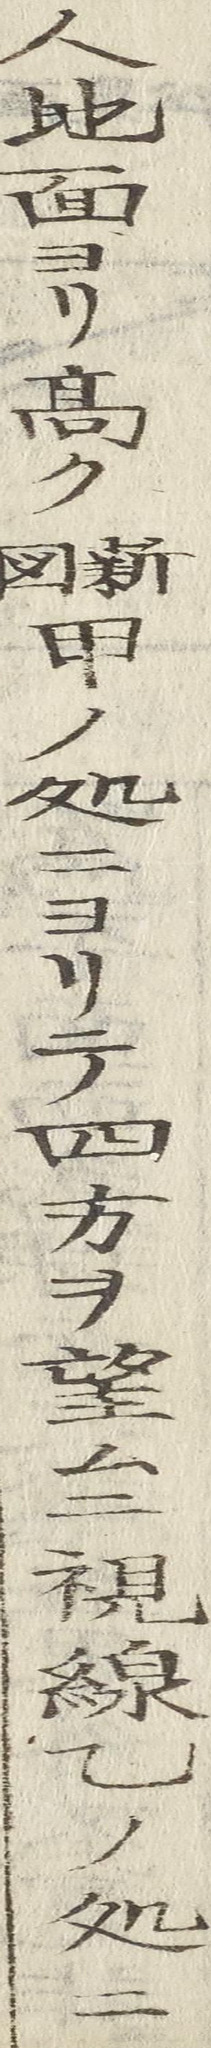人地面ヨリ高ク新図甲ノ処ニヨリテ四方ヲ望ムニ視線乙ノ処ニ
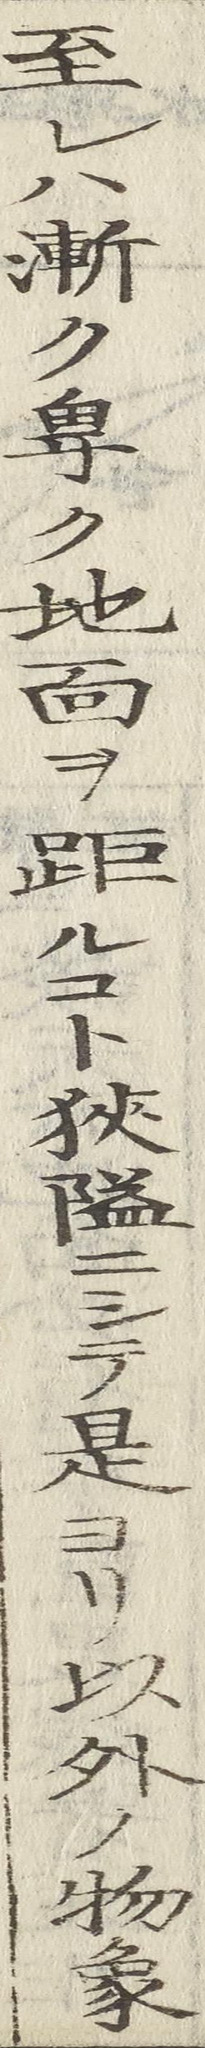至レハ漸ク卑ク地面ヲ距ルコト狭隘ニシテ是ヨリ以外ノ物象
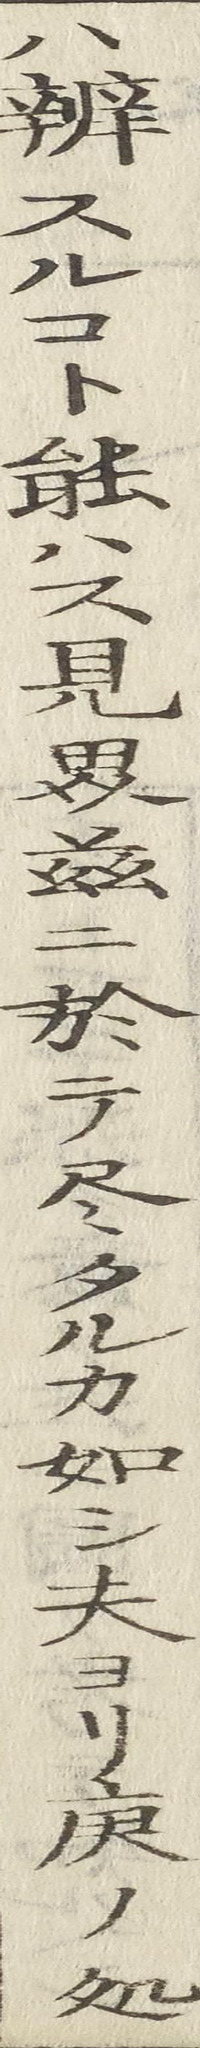ハ弁スルコト能ハス見界茲ニ於テ尽タルカ如シ夫ヨリ庚ノ処
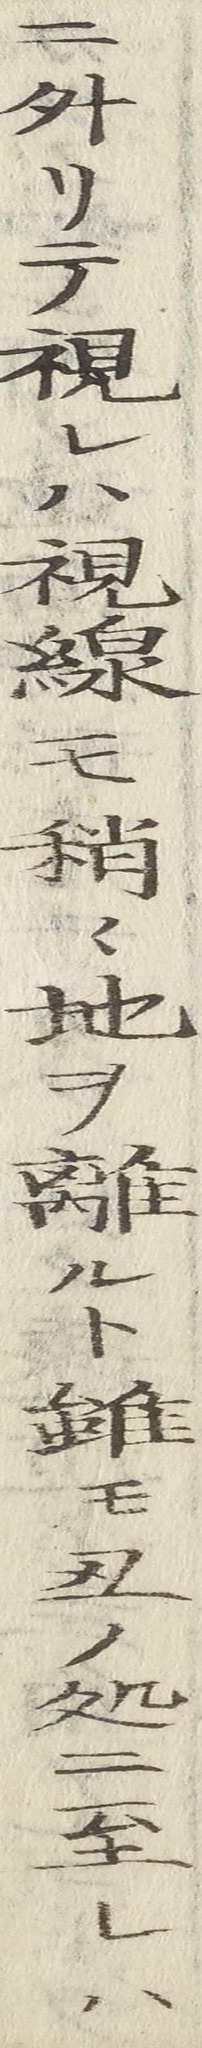ニ外リテ視レハ視線モ稍〱地ヲ離ルト雖モ丑ノ処ニ至レハ
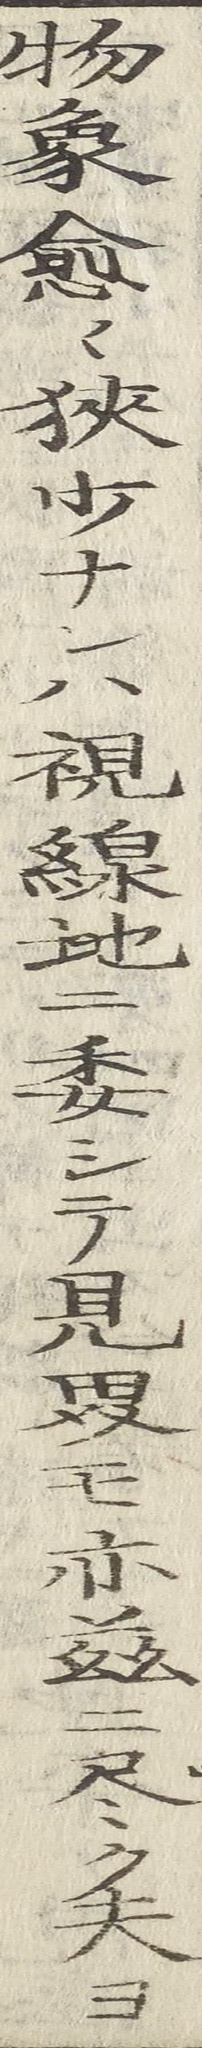物象愈〱狭少ナレハ視線地ニ委シテ見界モ亦茲ニ尽ク夫ヨ
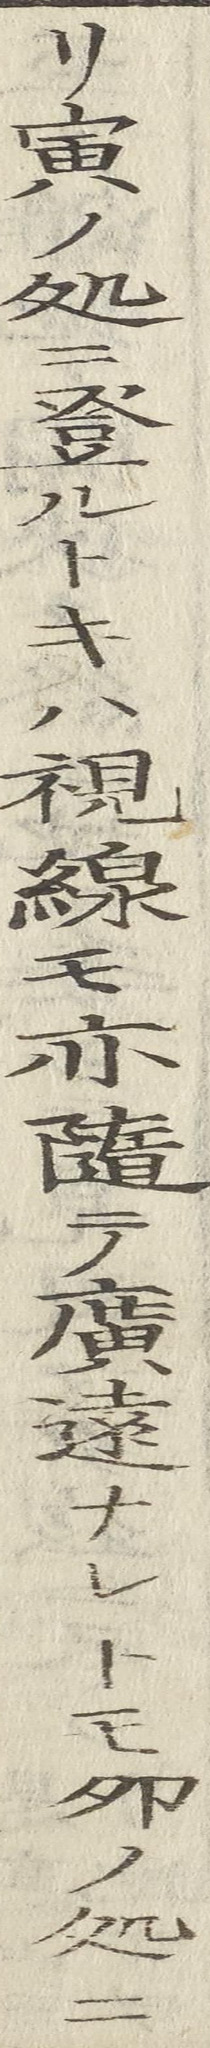リ寅ノ処ニ登ルトキハ視線モ亦随テ広遠ナレトモ卯ノ処ニ

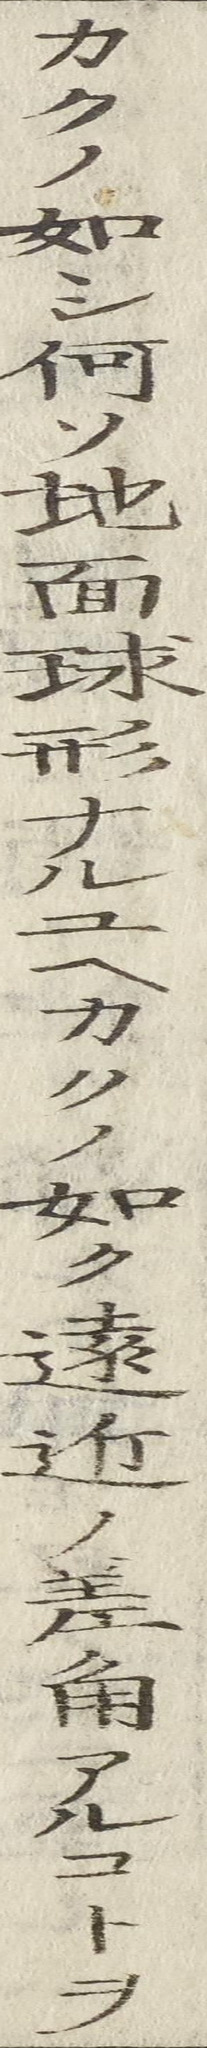カクノ如シ何ソ地面球形ナルユヘカクノ如ク遠近ノ差角アルコトヲ
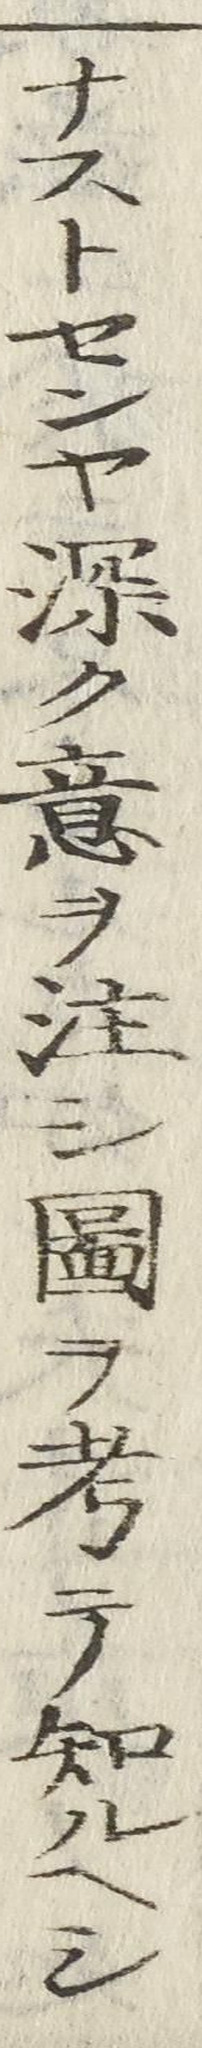ナストセンヤ深ク意ヲ注シ図ヲ考テ知ルヘシ
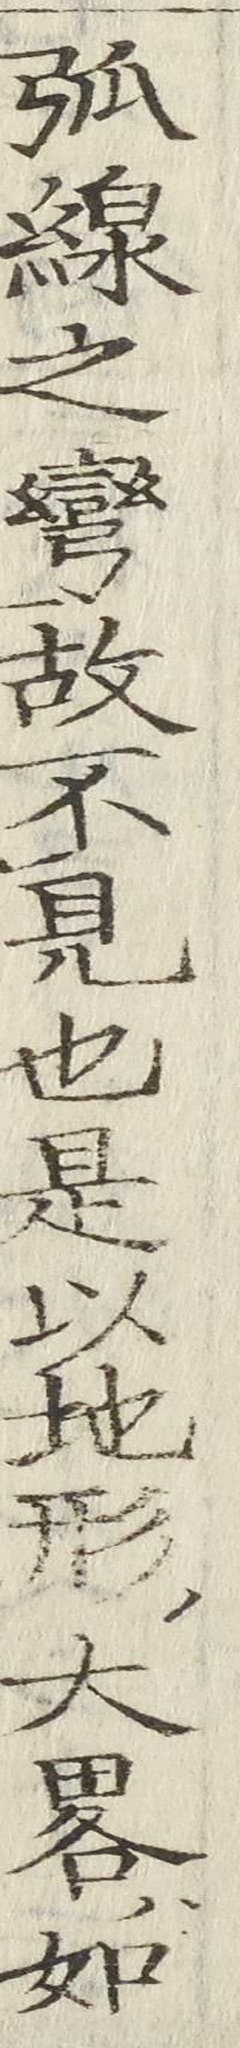弧線之彎故不見也是以地形大略如
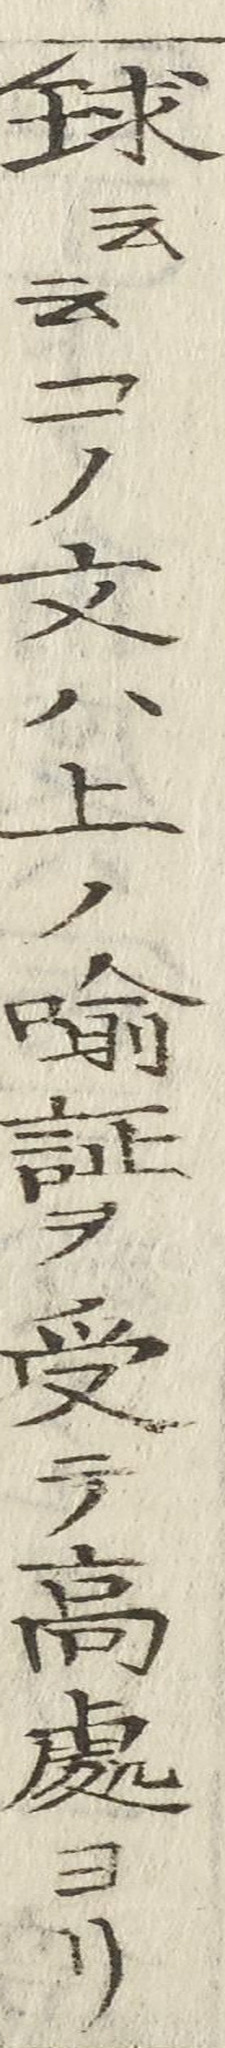球云云コノ文ハ上ノ喩証ヲ受テ高処ヨリ
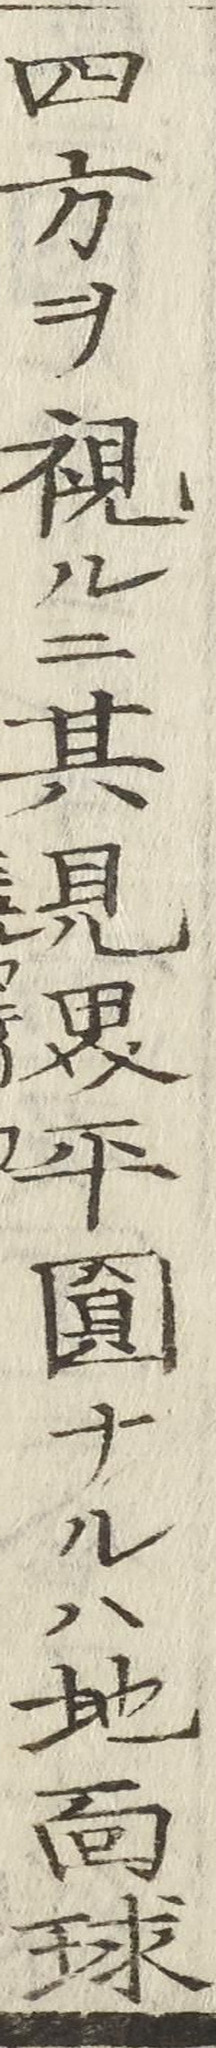四方ヲ視ルニ其見界平円ナルハ地面球
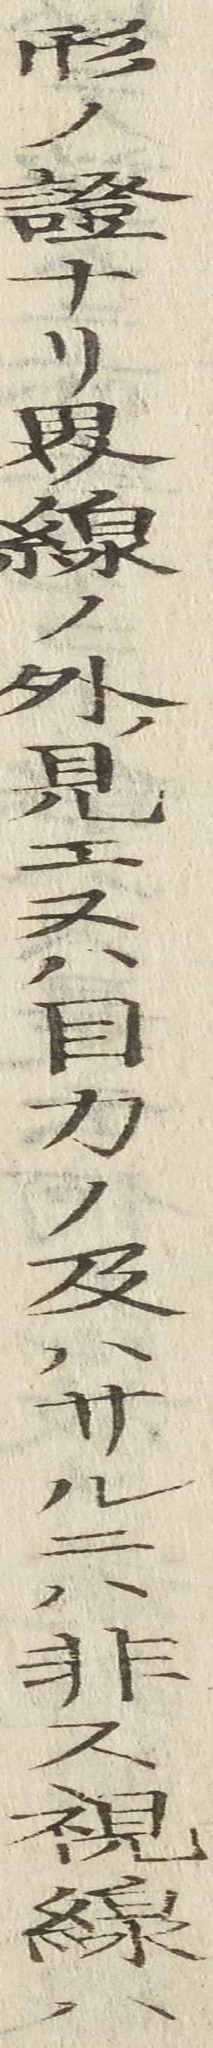形ノ証ナリ界線ノ外見エヌハ目力ノ及ハサルニハ非ス視線ハ
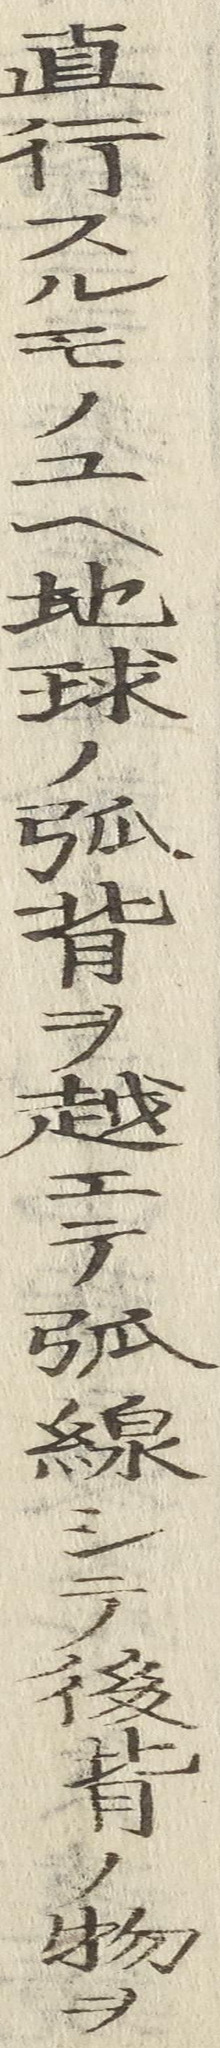直行スルモノユヘ地球ノ弧背ヲ越エテ弧線シテ後背ノ物ヲ
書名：護法新論　二編　下
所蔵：東京大学地震研究所図書室 Earthquake Research Institute Library, The University of Tokyo, JAPAN
